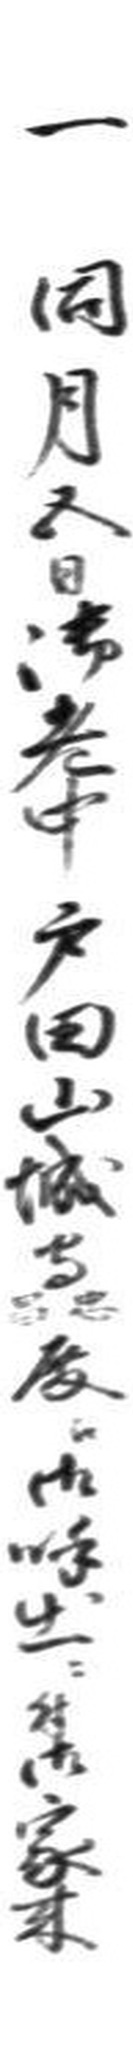一同月五日御老中戸田山城守忠昌殿江御呼出ニ付御家来
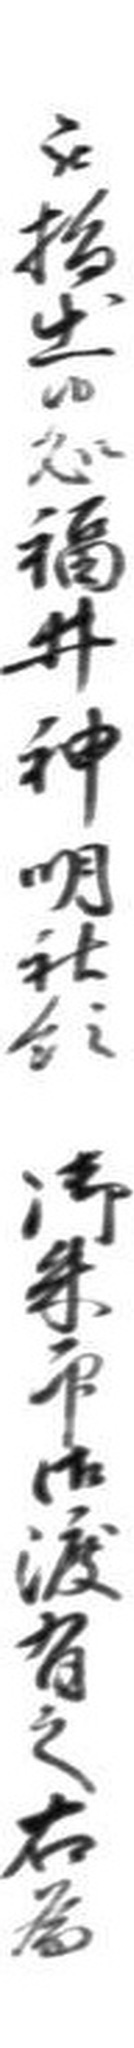被召出候処福井神明神社領御朱印御渡有之右為
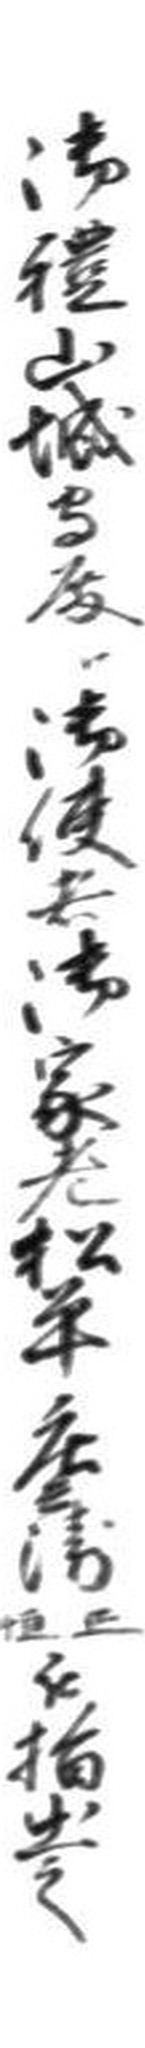御礼山城守殿江御使者御家老松平庄兵衛正恒被指出之

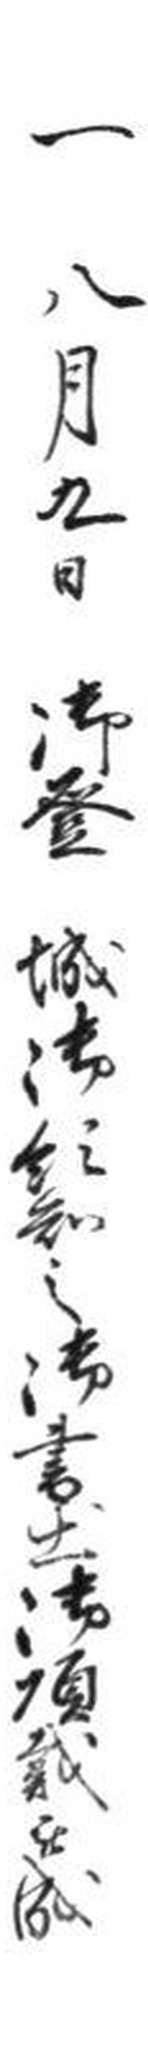一八月九日御登城御領知御書出御頂戴被成
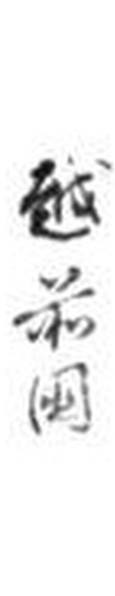越前国
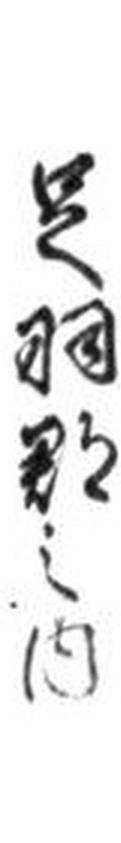吉田郡之内
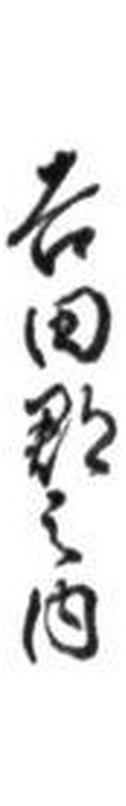吉田郡之内
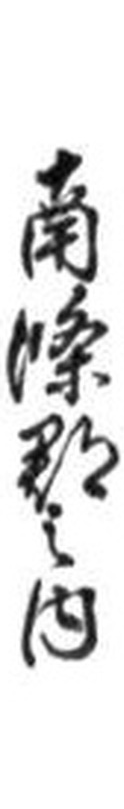南條郡之内
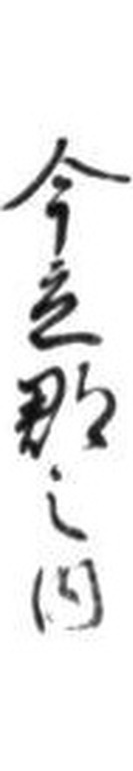今立郡之内
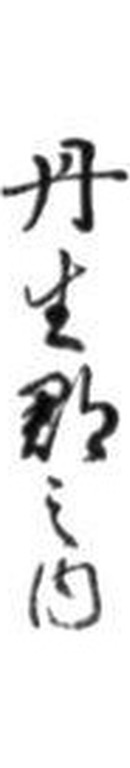丹生郡之内
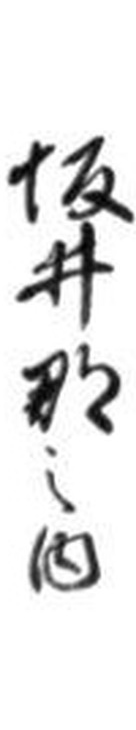坂井郡之内
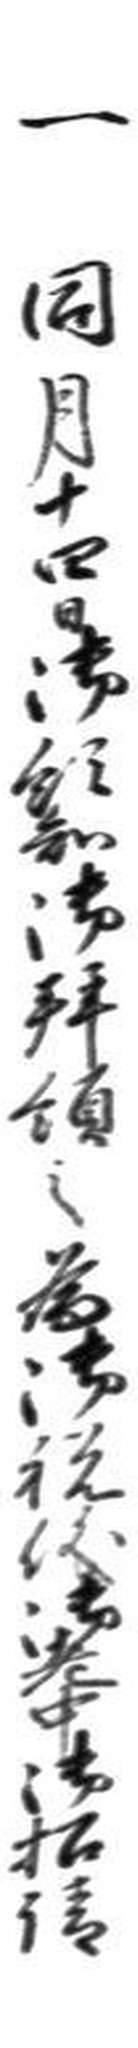一同月十四日御領知御拝領之為御祝儀御老中御招請
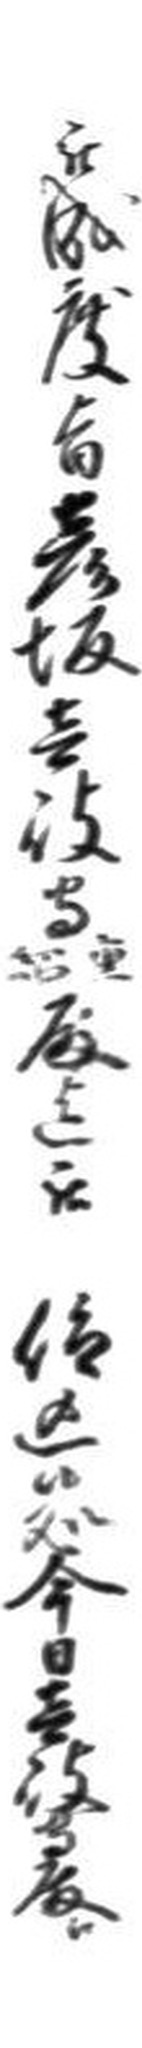被成度旨彦坂壱岐守重紹殿迄被仰込候処今日壱岐守殿江
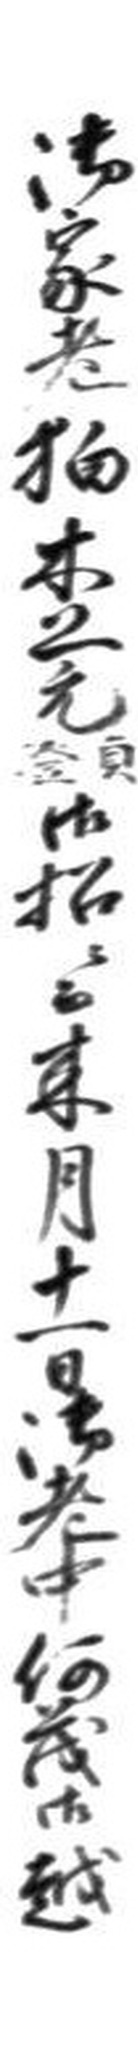御家老狛杢允貞澄御招ニ而来月十一日御老中何茂御越
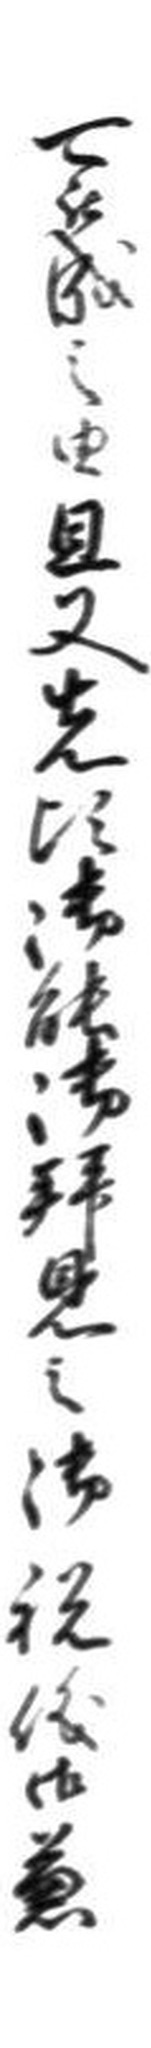可被成之由且又先頃御能御拝見之御祝儀御兼
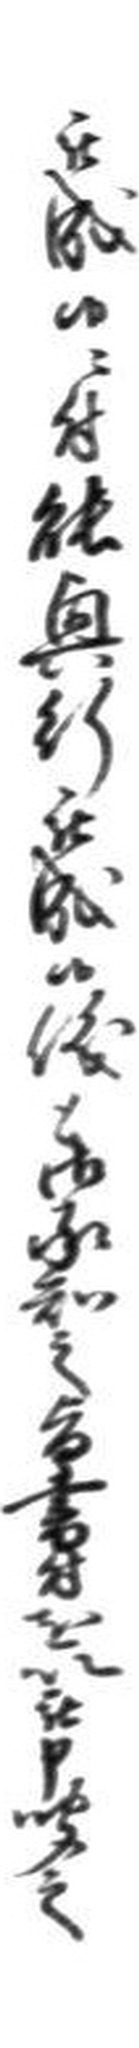被成候ニ付能興行被成候儀も御承知之旨書付を以被申聞之
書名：家譜 十六 吉品公 従貞享三年閏三月到同四年
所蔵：福井県文書館 Fukui Prefectural Archives
